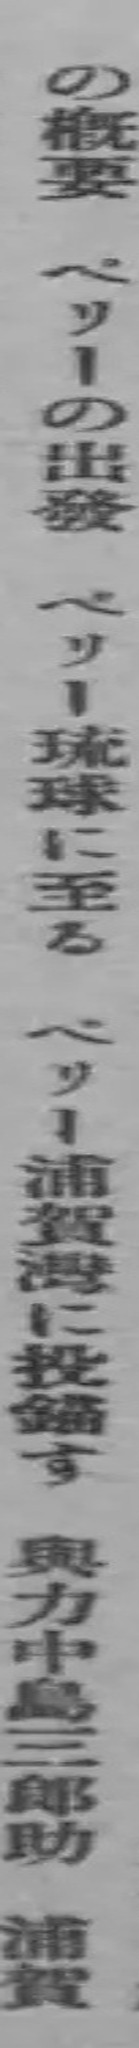の概要ペリーの出発ペリー琉球に至るペリー浦賀湾に投錨す与力中島三郎助浦賀
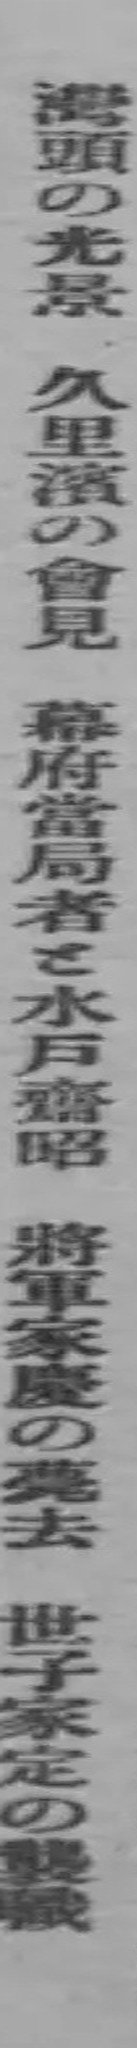湾頭の光景久里浜の会見幕府当局者と水戸斉昭将軍家慶の薨去世子家定の襲職
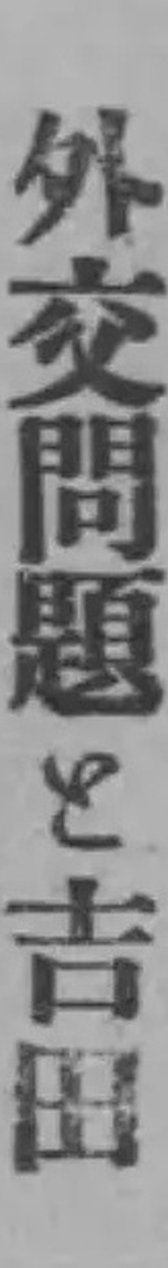外交問題と吉田
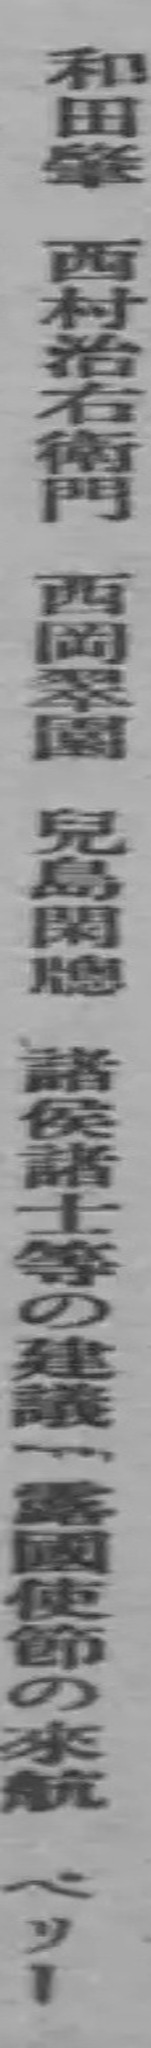和田肇西村治右衛門西岡翠園児島閑牕諸侯諸士等の建議露国使節の来航ペリー
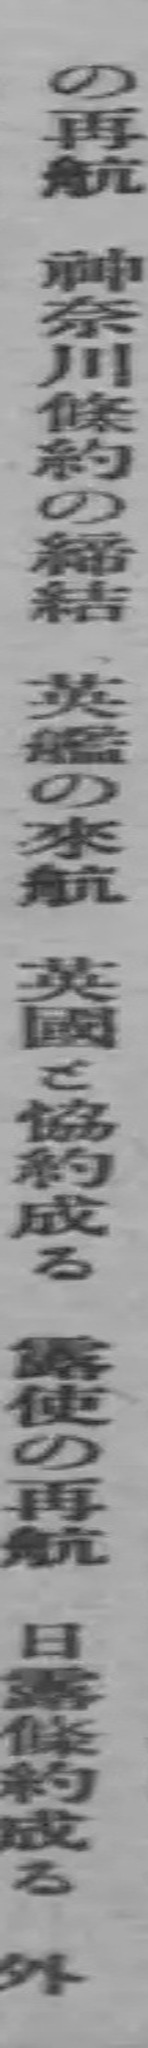の再航神奈川条約の締結英艦の来航英国と協約成る露使の再航日露条約成る外
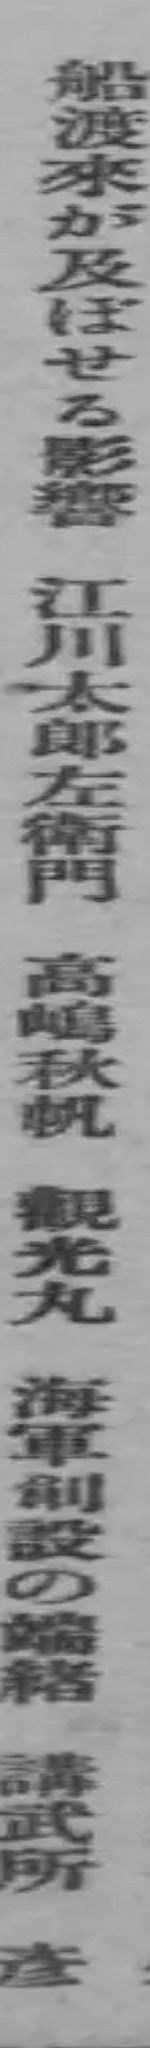船渡来が及ぼせる影響江川太郎左衛門高嶋秋帆観光丸海軍制設の端緒講武所彦
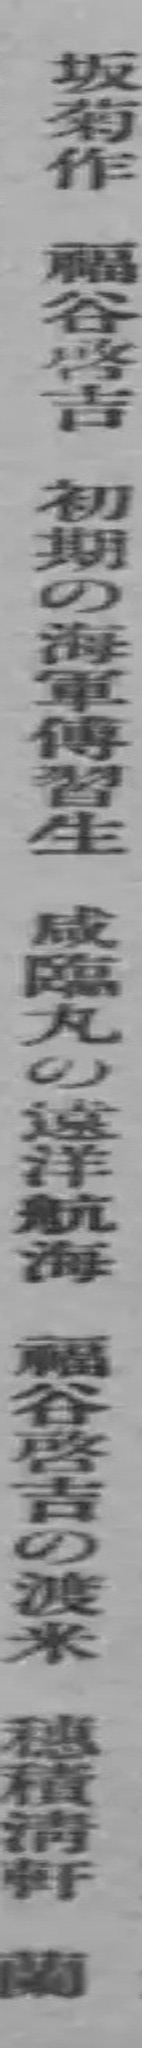坂菊作福谷啓吉初期の海軍伝習生咸臨丸の遠洋航海福谷啓吉の渡米穂積清軒蘭
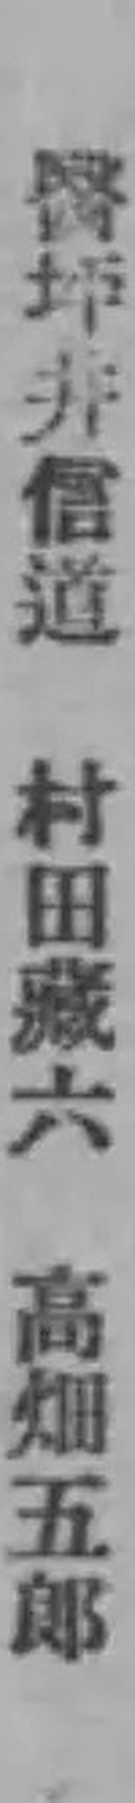医坪井信道村田蔵六高畑五郎
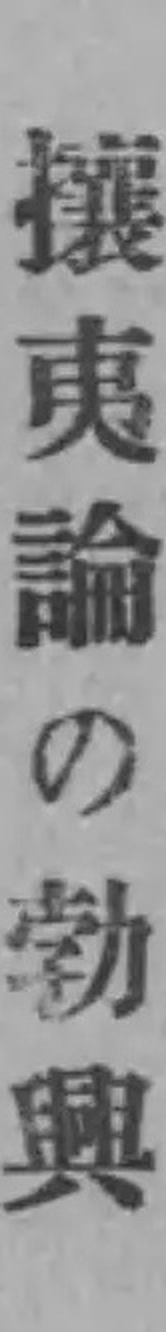攘夷論の勃興
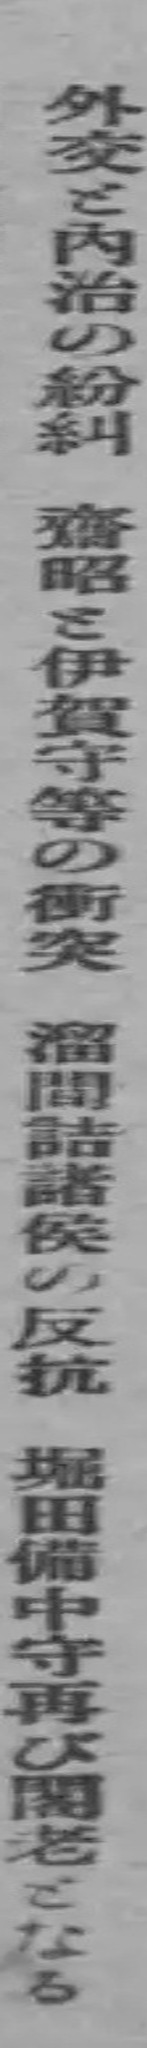外交と内治の紛糾斉昭と伊賀守等の衝突溜間詰諸侯の反抗堀田備中守再び閣老となる
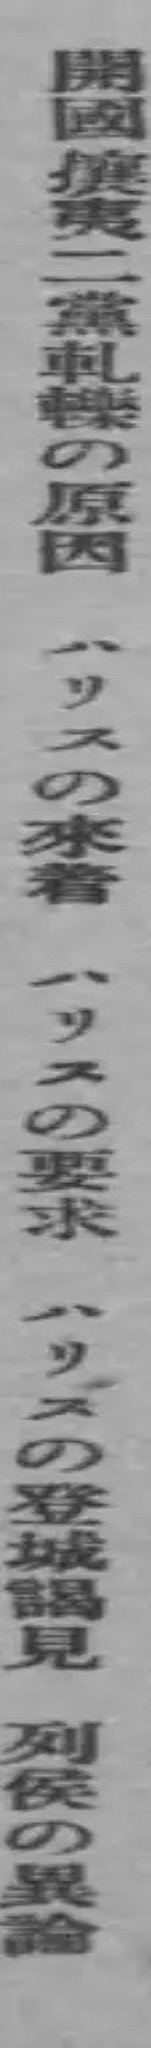開国攘夷二党軋轢の原因ハリスの来着ハリスの要求ハリスの登城謁見列侯の異論
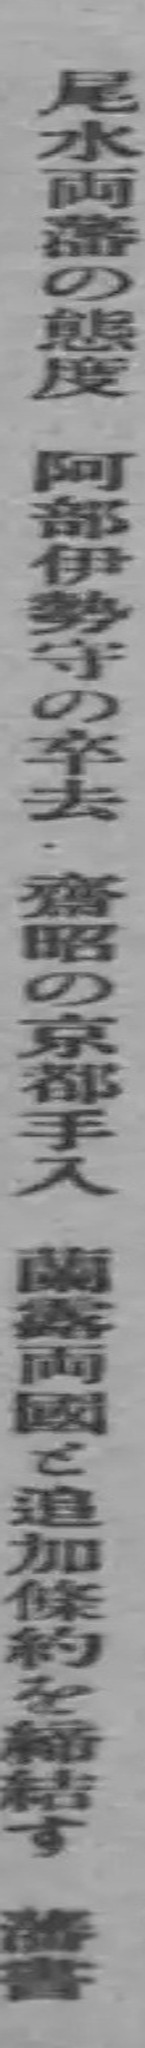尾水両藩の態度阿部伊勢守の卒去斉昭の京都手入蘭露両国と追加条約を締結す藩書
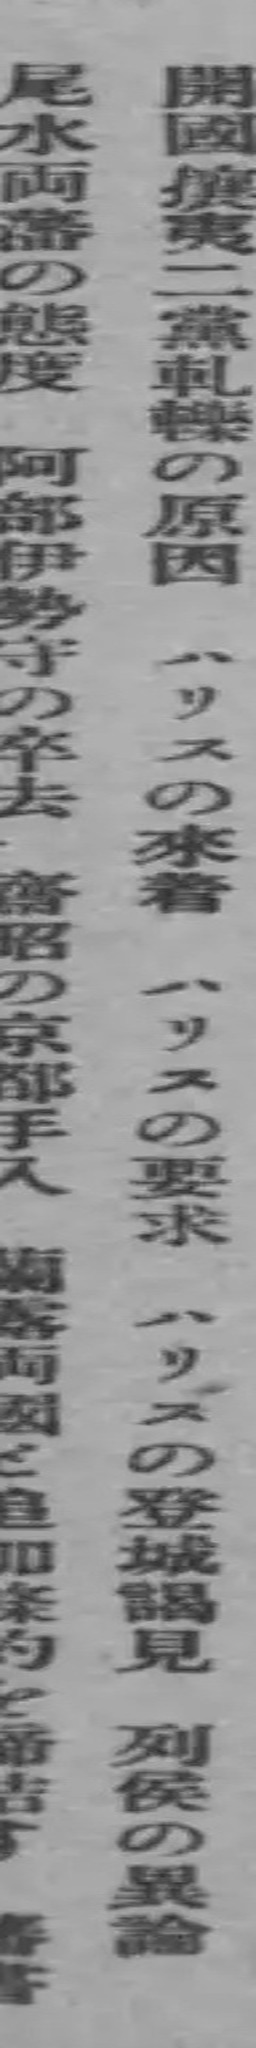尾水両藩の態度阿部伊勢守の卒去斉昭の京都手入蘭露両国と追加条約を締結す藩書
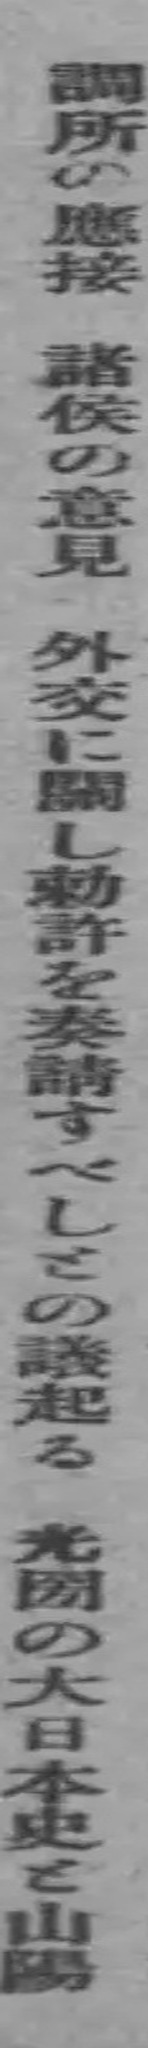調所の応接諸侯の意見外交に関し勅許を奏請すべしとの議起る光圀の大日本史と山陽

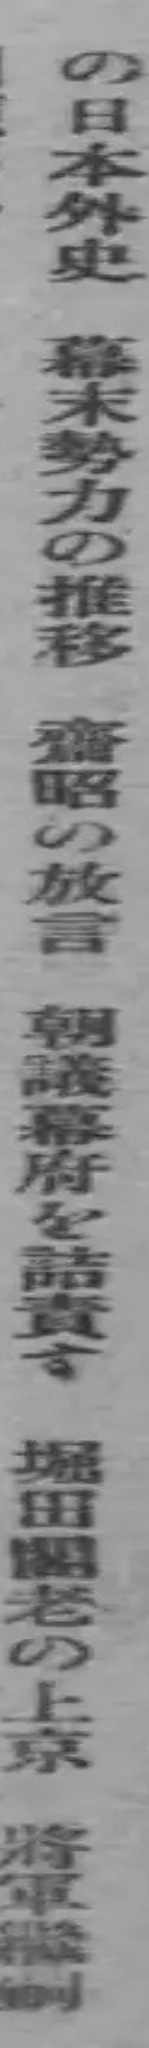の日本外史幕末勢力の推移斉昭の放言朝議幕府を詰責す堀田閣老の上京将軍継嗣
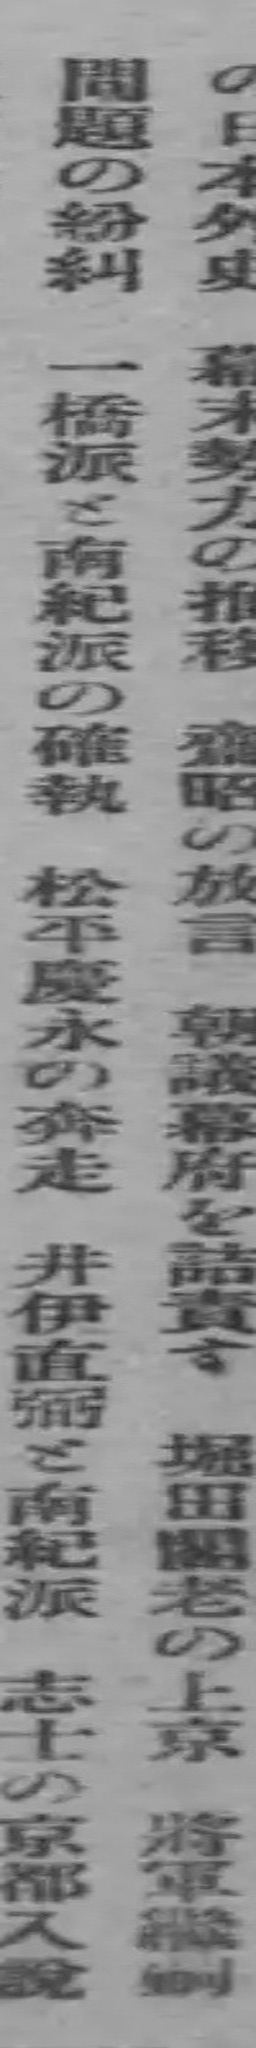問題の紛糾一橋派と南紀派の確執松平慶永の奔走井伊直弼と南紀派志士の京都入説
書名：豊橋市史談
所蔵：国立国会図書館 National Diet Library, JAPAN
